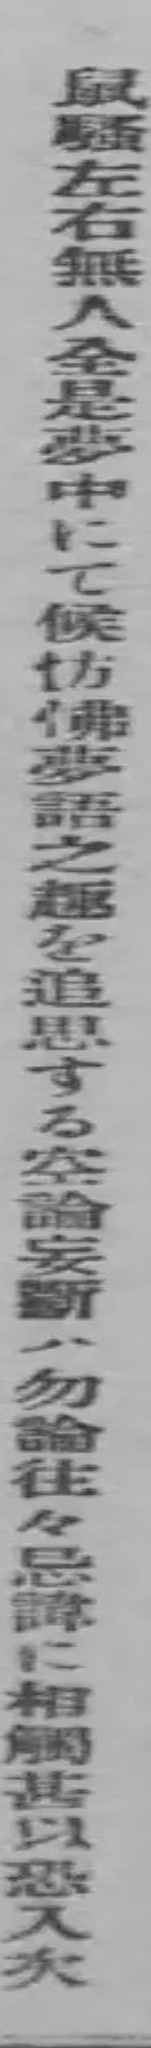鼠騒左右無人全是夢中にて候彷彿夢語之趣を追思する空論妄断ハ勿論往々忌諱に相触甚以恐入次
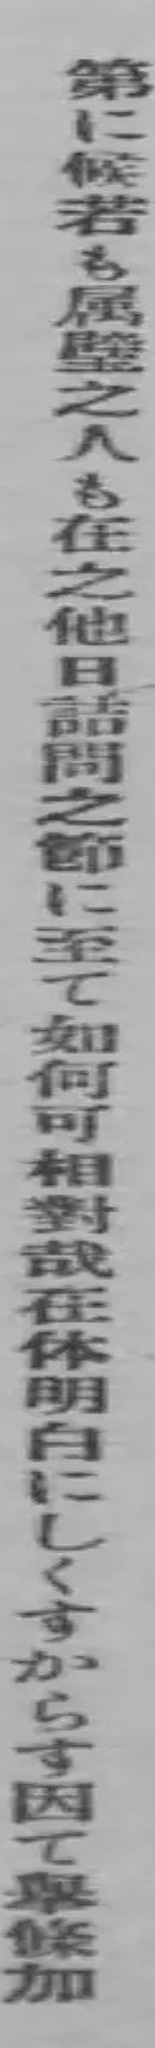第に候若も属璧之人も在之他日詰問之節に至て如何可相対哉在体明白にしくすからす因て挙条加
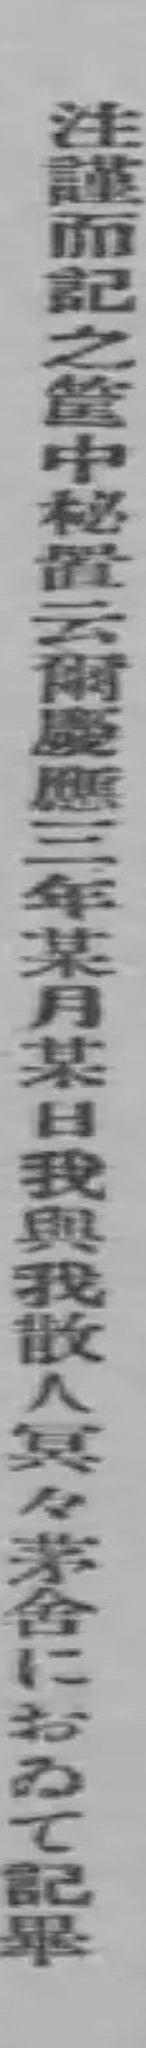注謹而記之筐中柲置云爾慶応三年某月某日我與我散人冥々茅舎におゐて記畢
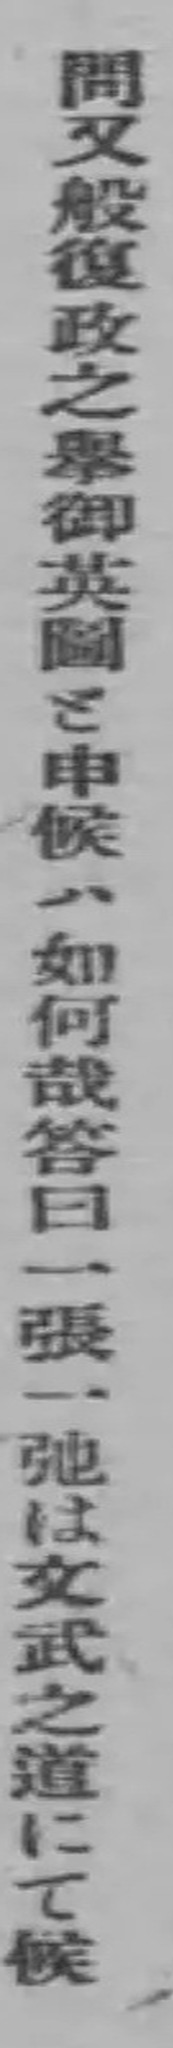問又般復政之挙御英国と申候ハ如何哉答曰一張一弛は文武之道にて候
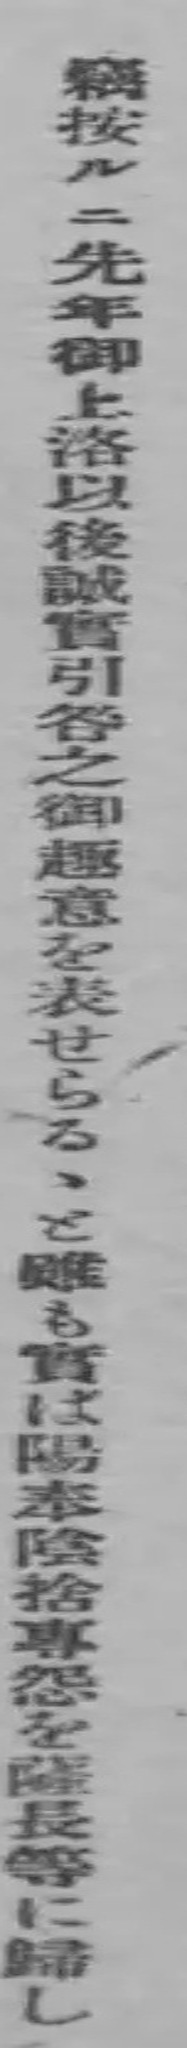竊按ルニ先年御上洛以後誠実引咎之御趣意を表せらるゝと雖も実は陽奉陰捨専怨を薩長等に帰し
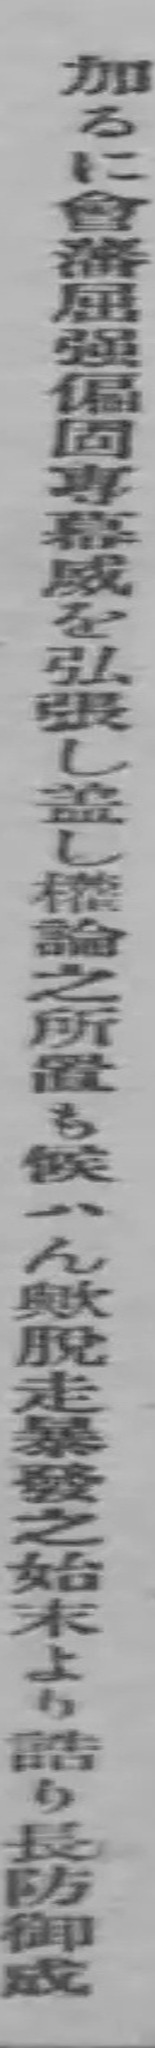加るに会藩屈強偏固専幕威を弘張し盖し権論之所置も候ハん歟脱走暴発之始末より誥り長防御成
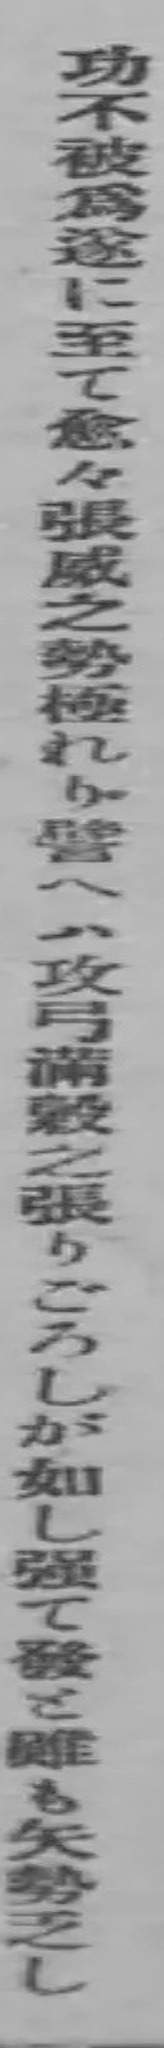功不被為遂に至て愈々張威之勢極れり譬ヘハ攻弓満穀之張りごろしが如し強て発と雖も矢勢乏し
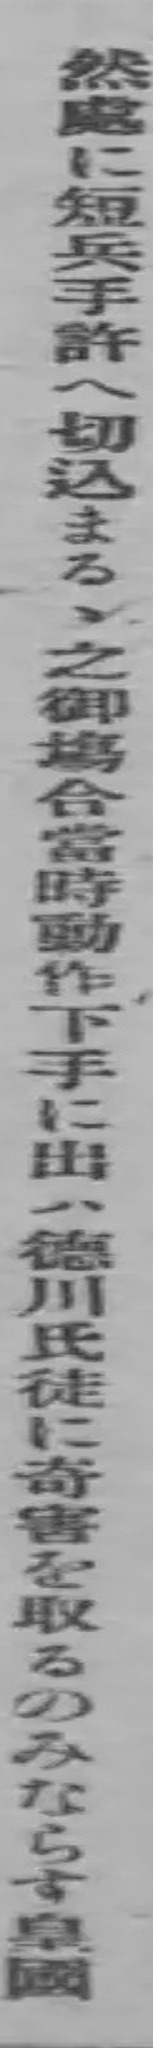然処に短兵手許へ切込まるゝ之御場合当時動作下手に出ハ徳川氏徒に奇害を取るのみならす皇国
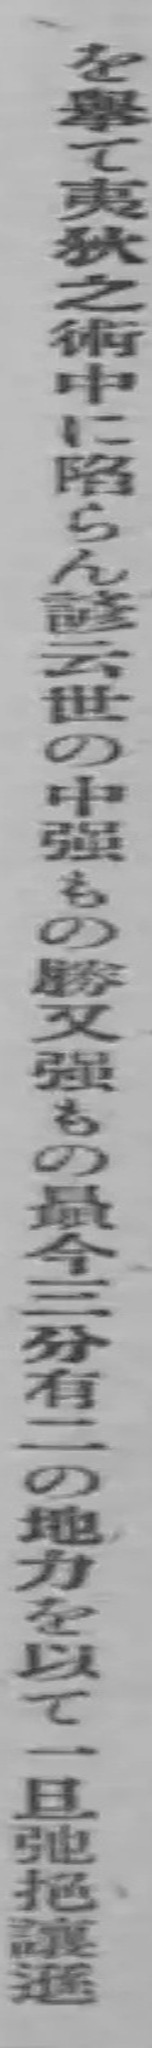を挙て夷狄之術中に陥らん諺云世の中強もの勝又強もの贔今三分有二の地力を以て一旦弛挹譲遜
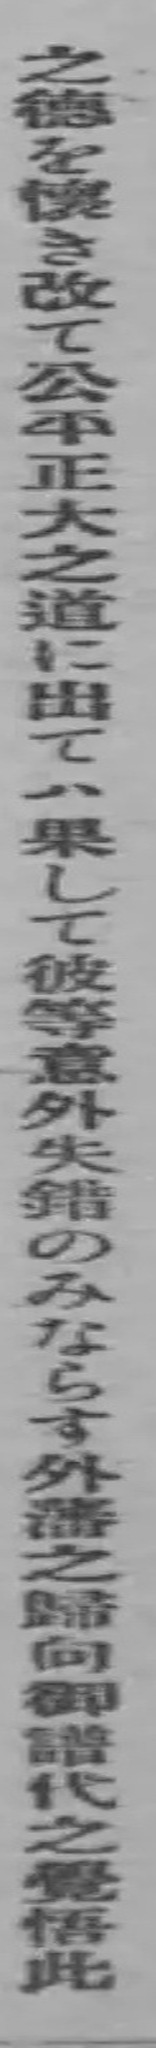之徳を懐き改て公平正大之道に出てハ果して彼等意外失錯のみならす外藩之帰向御譜代之覚悟此
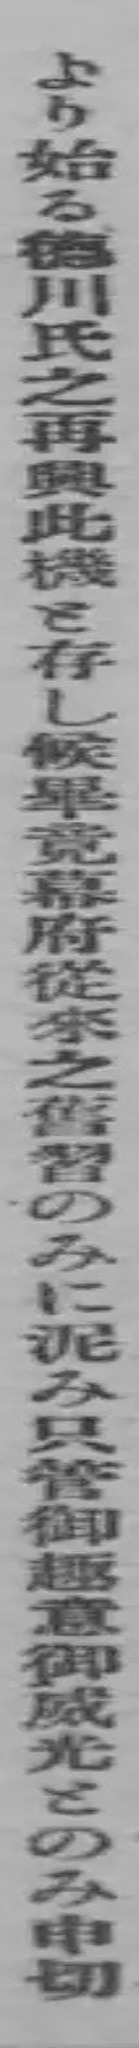より始る徳川氏之再興此機と存し候畢竟幕府従来之旧習のみに泥み只管御趣意御威光とのみ申切
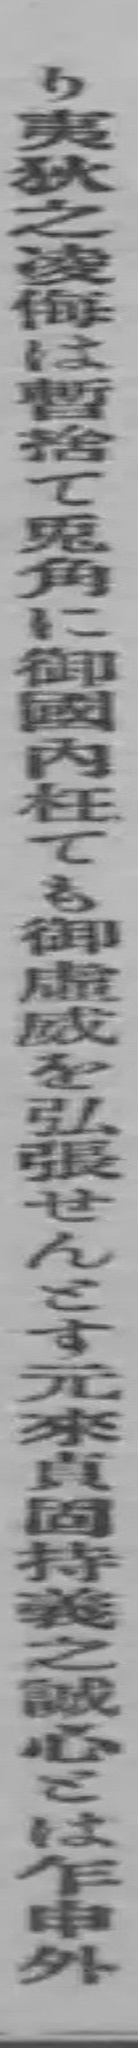り夷狄之凌侮は暫捨て兎角に御国内枉ても御虚威を弘張せんとす元来貞固持義之誠心とは乍申外
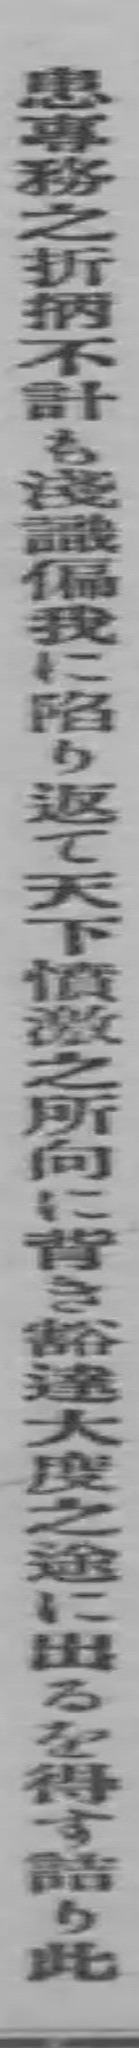患専務之折柄不計も浅識偏我に陥り返て天下憤激之所向に背き豁達大度之途に出るを得す詰り此
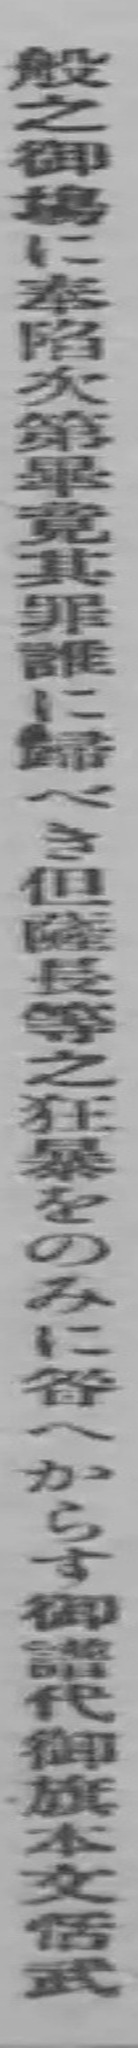般之御場に奉陥次第畢竟其罪誰に帰べき但薩長等之狂暴をのみに咎へからす御譜代御旗本文恬武
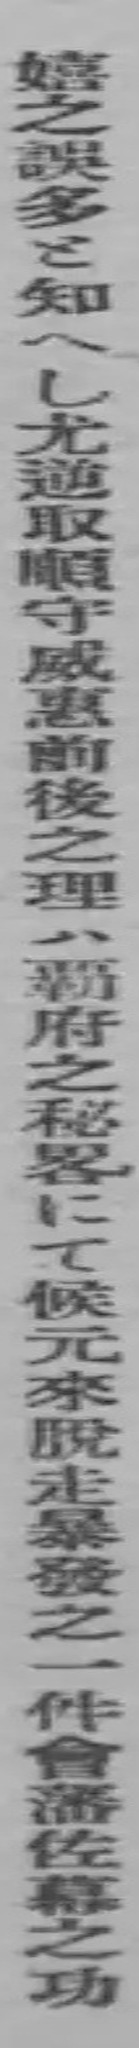嬉之誤多と知へし尤逆取順守威恵前後之理ハ覇府之秘略にて候元来脱走暴発之一件会藩佐幕之功
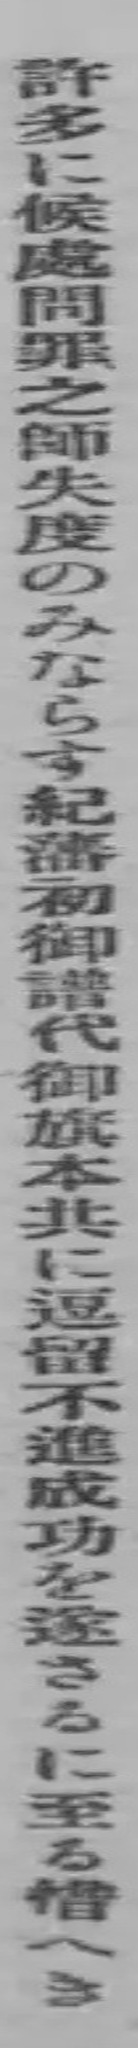許多に候処問罪之師失度のみならす紀藩初御譜代御旗本共に逗留不進成功を遂さるに至る惜へき
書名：豊橋市史談
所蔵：国立国会図書館 National Diet Library, JAPAN
